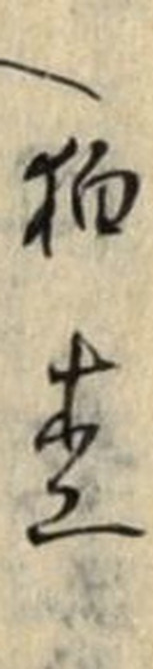狛木工

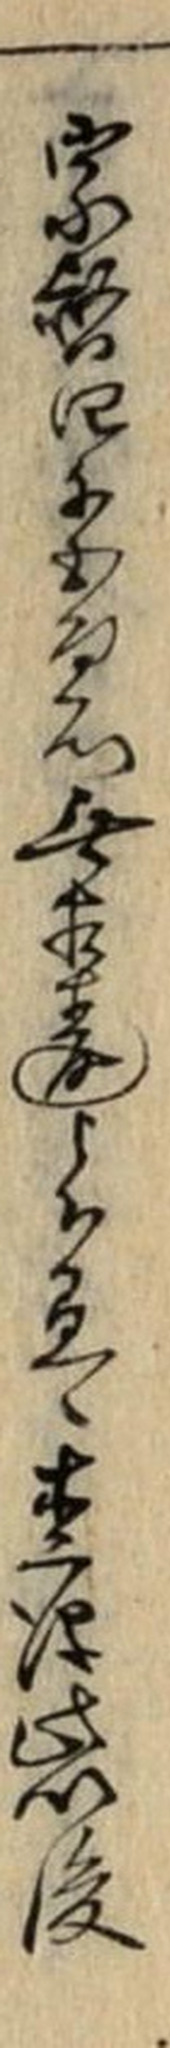家督四千五百石無相違被下置候木工儀此以後同長吉
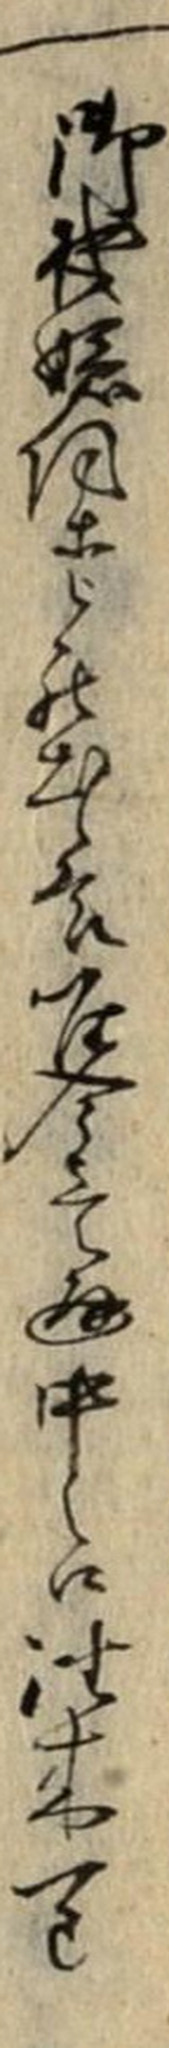御機嫌伺等被罷出候節唯今迄之通中之口往来可被
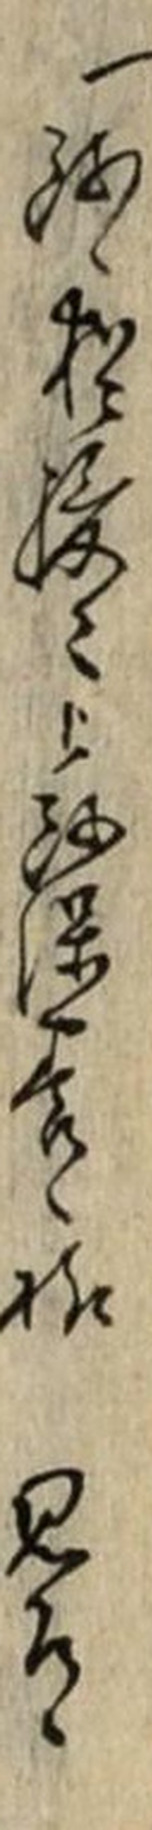致候猶緩々被致保養候様思召候
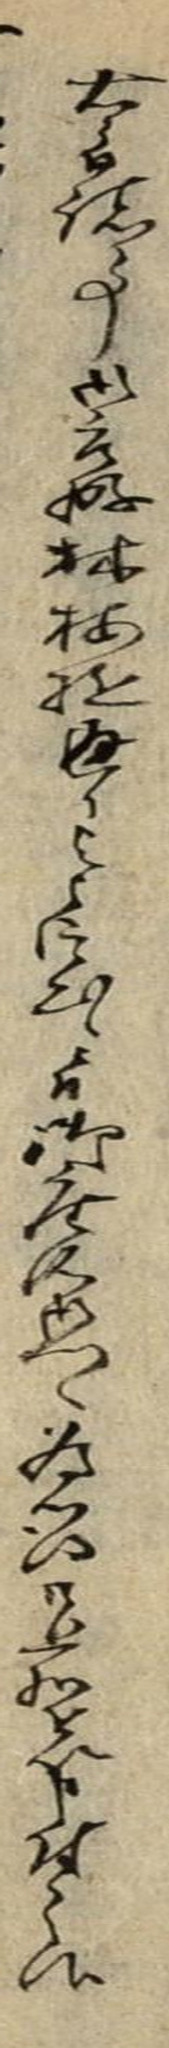右に付諸事御取扱林梅遊通り被仰出候に付御座所御門へ為心得口上書扣を以申付之候
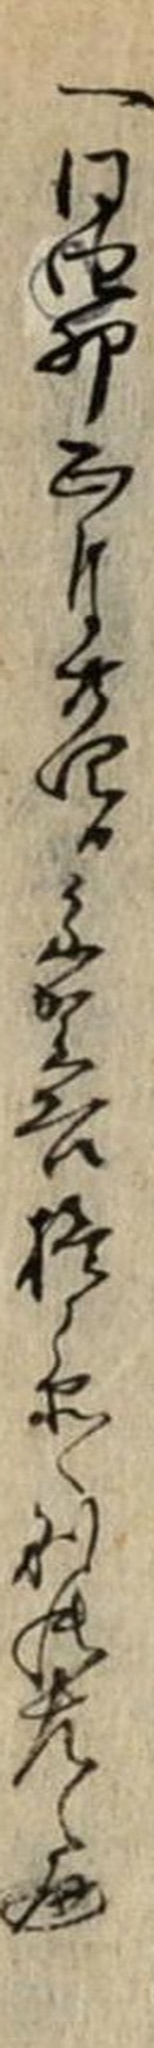一同四卯正月廿四日多賀谷権兵衛へ別紙左之通
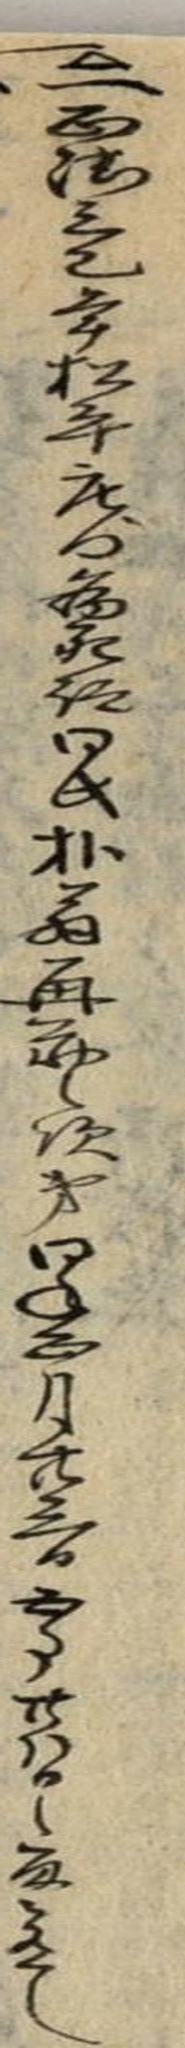△一正徳三巳年松平庄右衛門病死跡同氏朴翁再勤之次第同年正月廿三日五月廿八日之留に有之
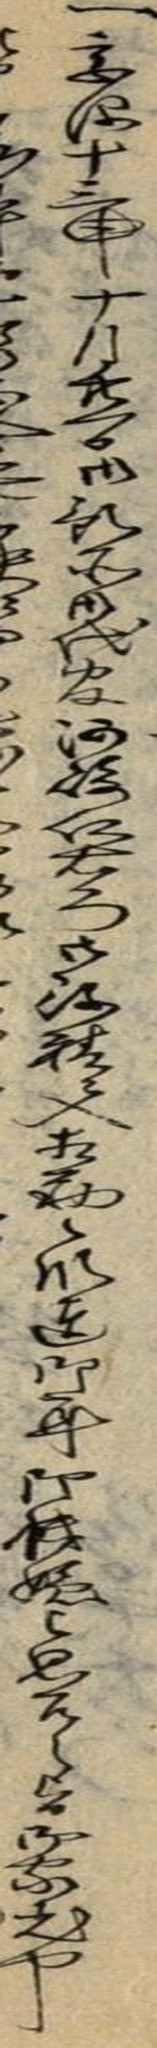一享保十三申十月廿一日御預所御代官河崎仁右衛門御役精に入相勤候段達御耳御機嫌被思召候旨御家老中
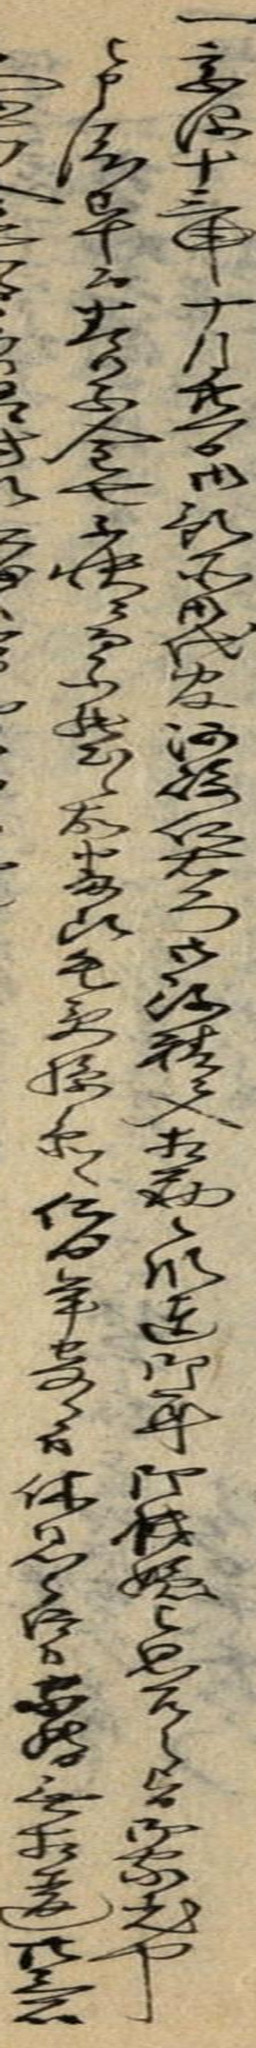被申渡畢而養子金七不快に而不罷出候故番頭毛受孫兵衛へ仁右衛門年寄候に付休息被仰付家督無相違廿三石
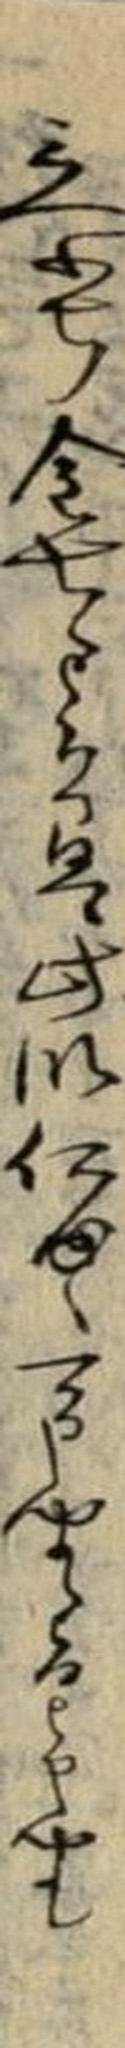三人ふち金七へ被下置候此段仁右衛門へ可申聞候旨被申聞候
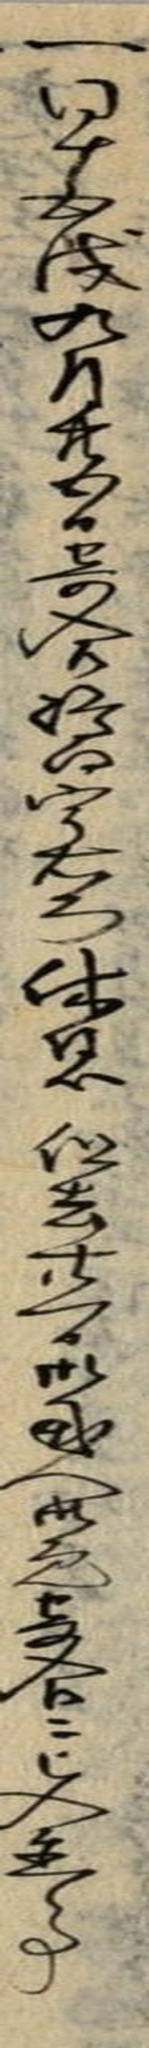一同十五戌九月廿五日寄合嶋田宇右衛門休息但去廿一日御用人御免寄合に被入置候事
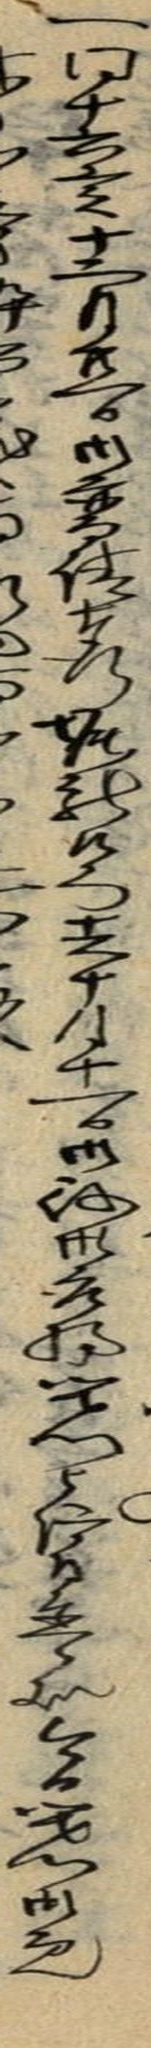一同十六亥十二月廿一日御普請奉行堀新左衛門去十月十一日御役御取揚閉門被仰付置候処今日閉門御免
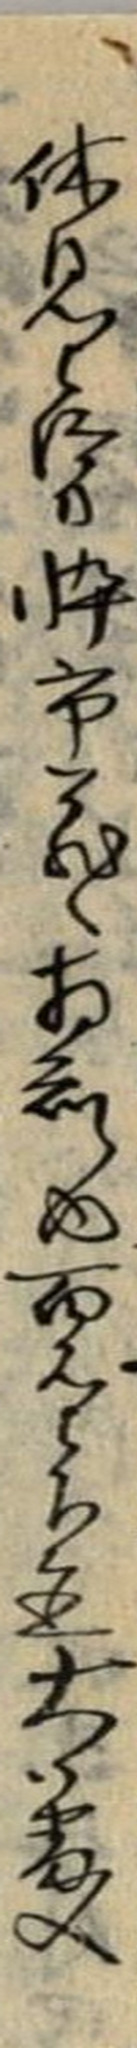休息被仰付忰市蔵へ拝知之内百石被下置大御番入
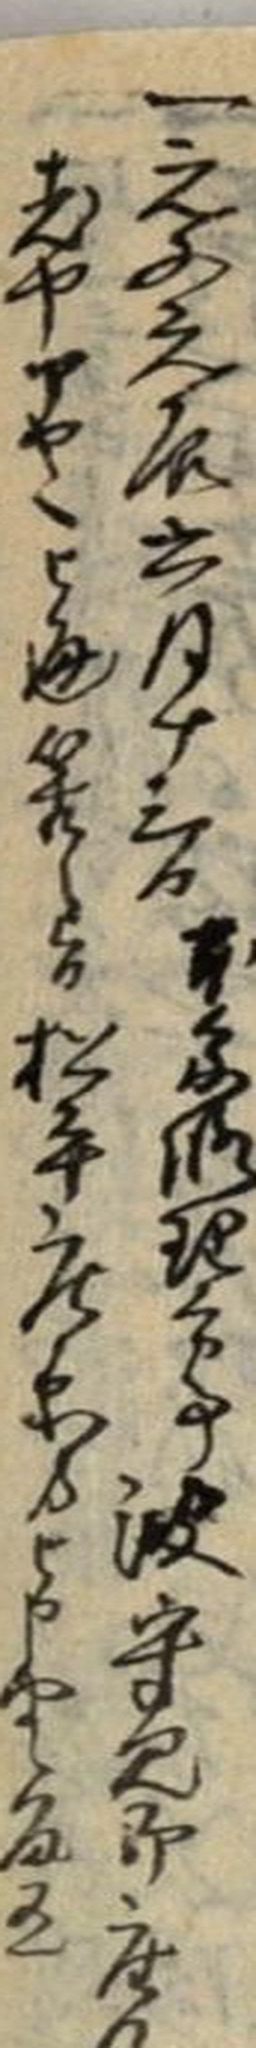老中部屋へ被通筈之旨松平庄兵衛方被申聞候留有
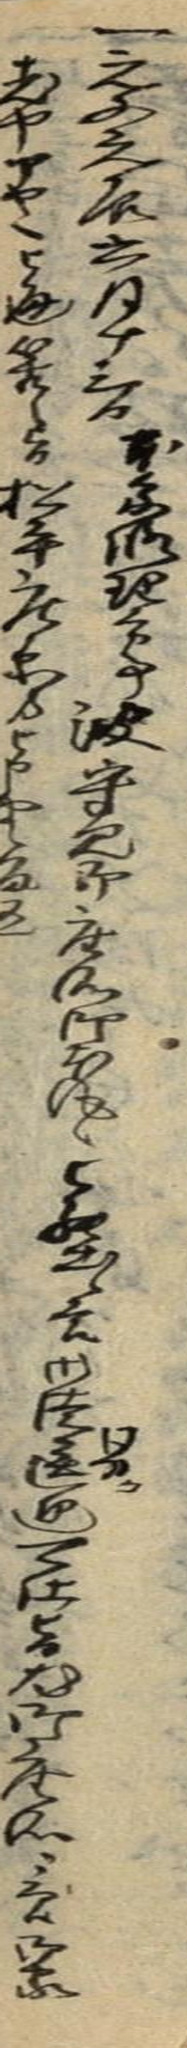一元文元辰六月十三日本多修理方事波守見御座所御本丸へ被罷出候節御徒目付送迎可仕旨尤御座所に而は御家
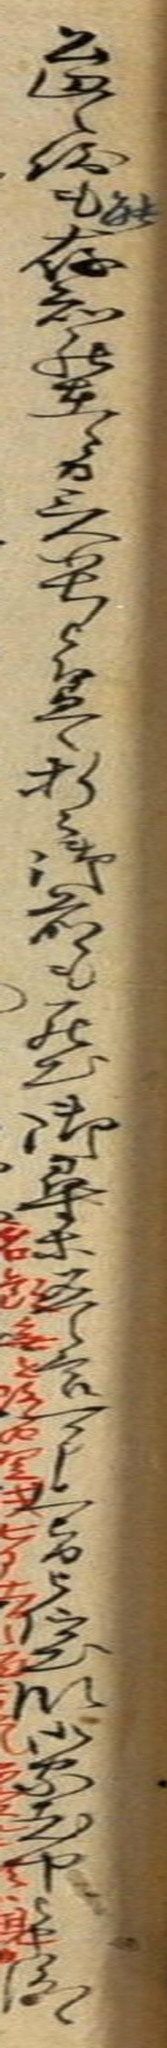公辺之儀も能存知罷在候に付三人ふち被下置候折々御前へも罷出御尋等有之節可申上旨被仰出候段御家老中被申渡候
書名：御用并被仰出之部
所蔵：福井県文書館 Fukui Prefectural Archives
